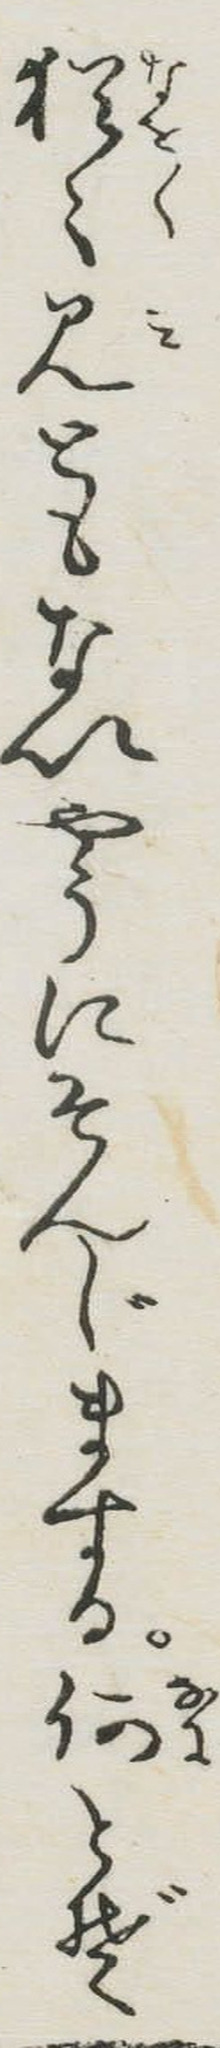猶々見ともないやうにそんじまする。何とぞ
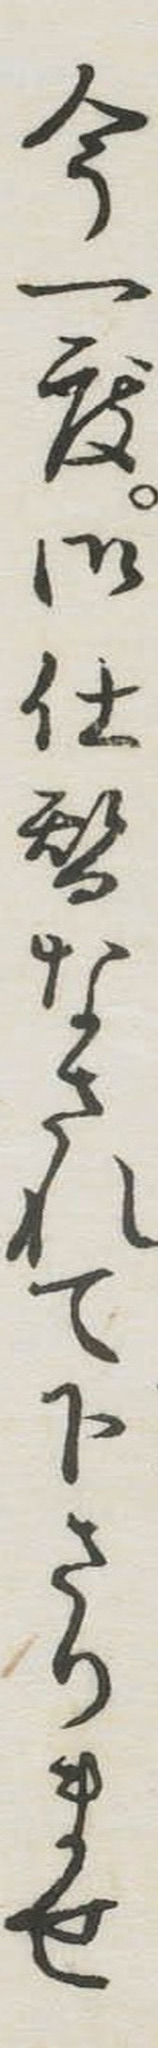今一度。御仕替なされて下さりませ
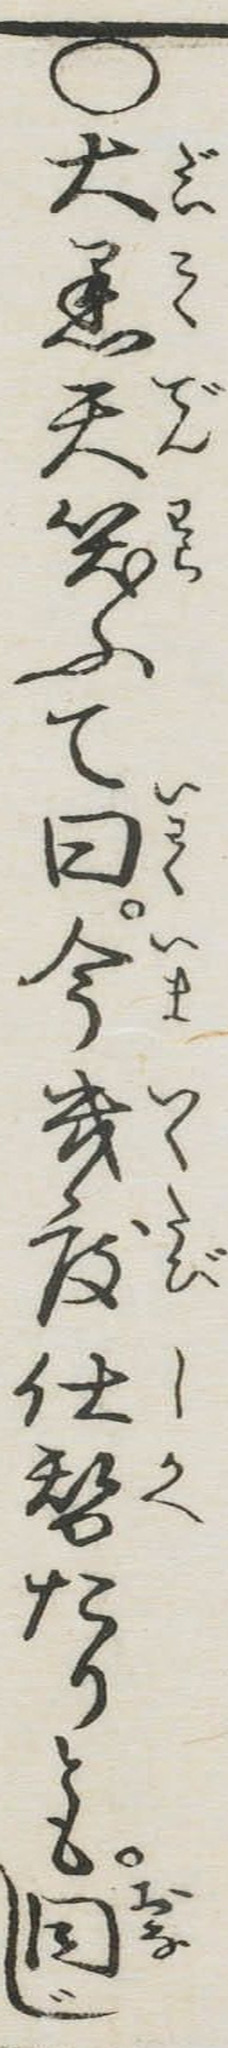○大黒天笑ふて曰。今幾度仕替たりとも。同じ
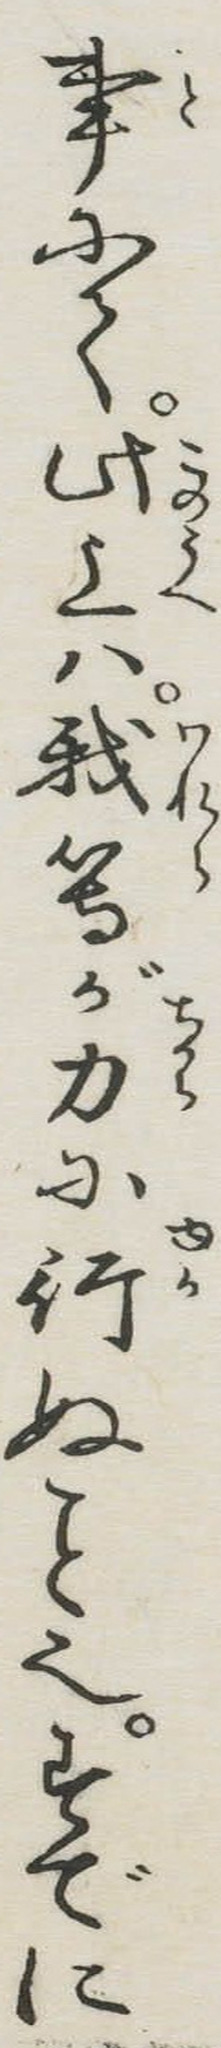事にて。此上は。我等が力に行ぬこと也。すでに
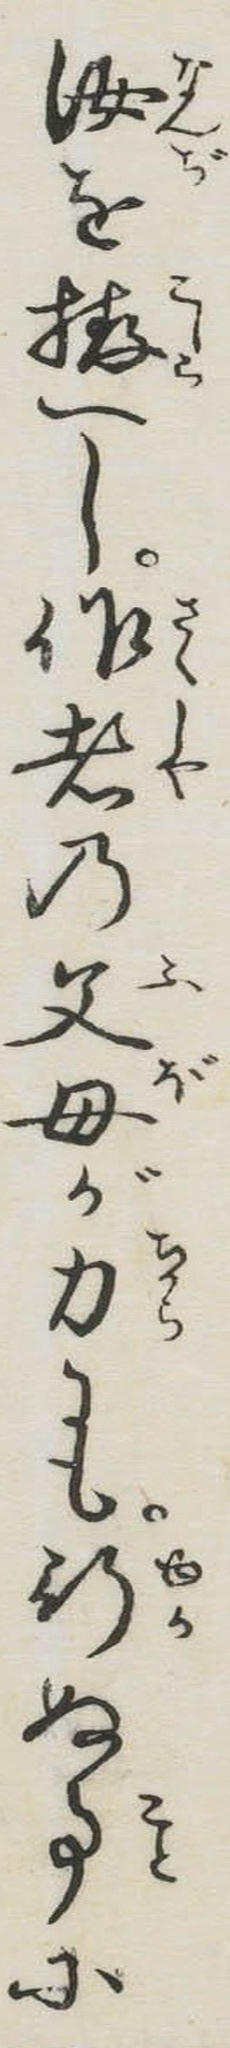汝を拵へし。作者の父母が力にも。行ぬ事に
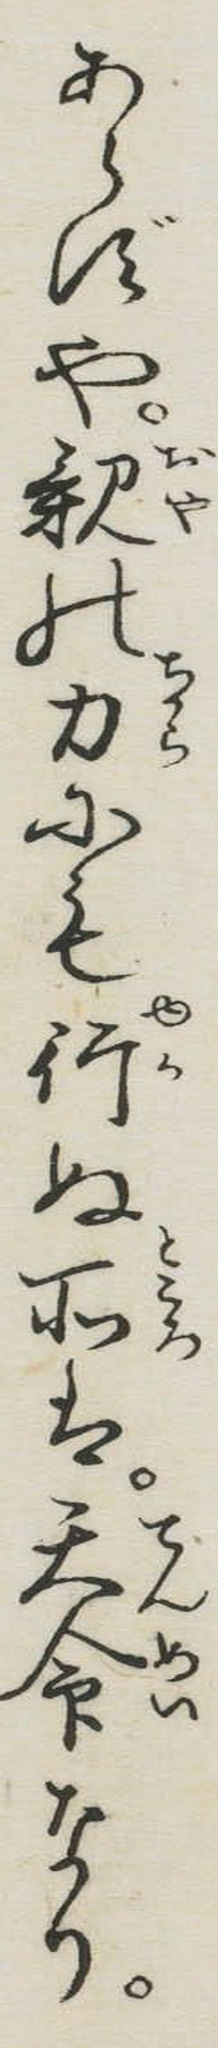あらずや。親の力にも行ぬ所は。天命なり。
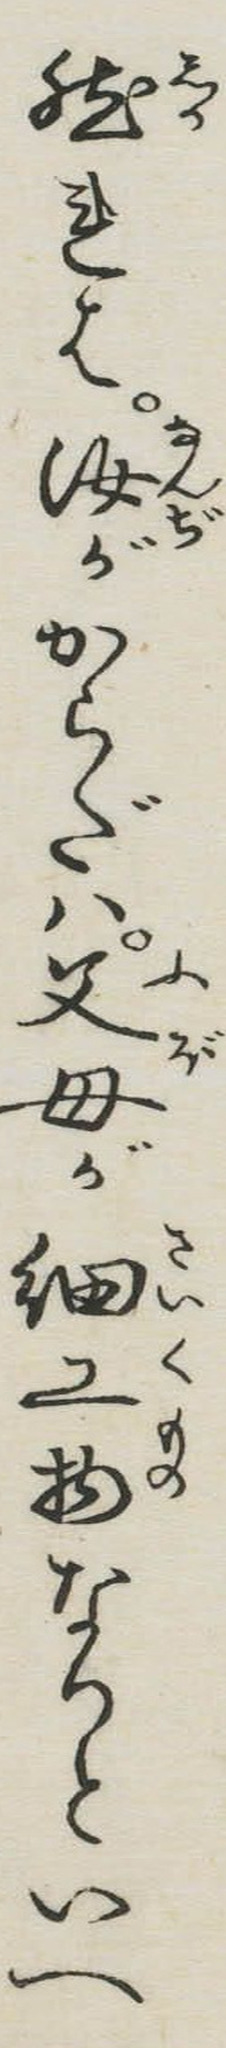然れは。汝がからだは。父母が細工物なりといへ
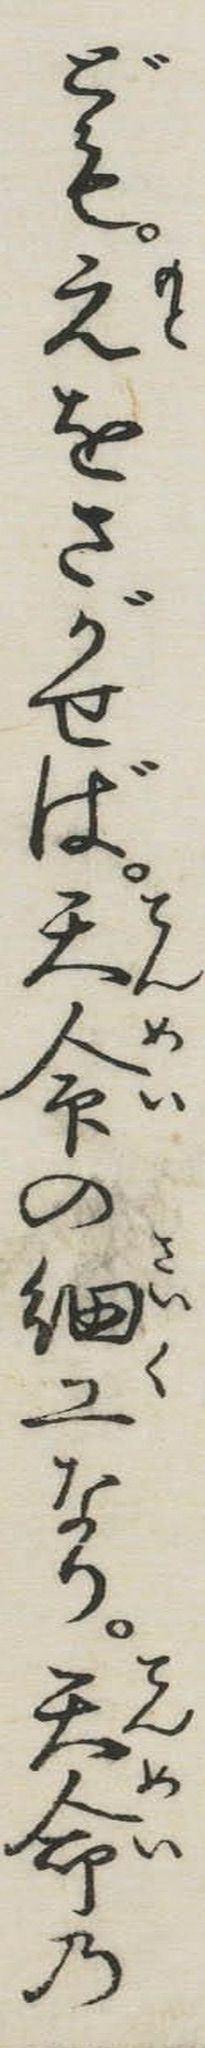ども。元をさがせば。天命の細工なり。天命の
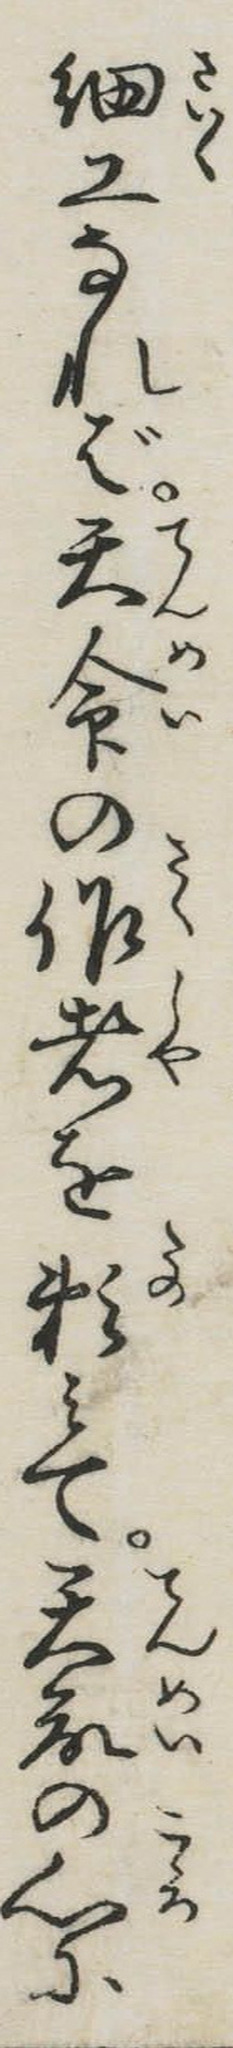細工なれば。天命の作者を頼みて。天命の心に

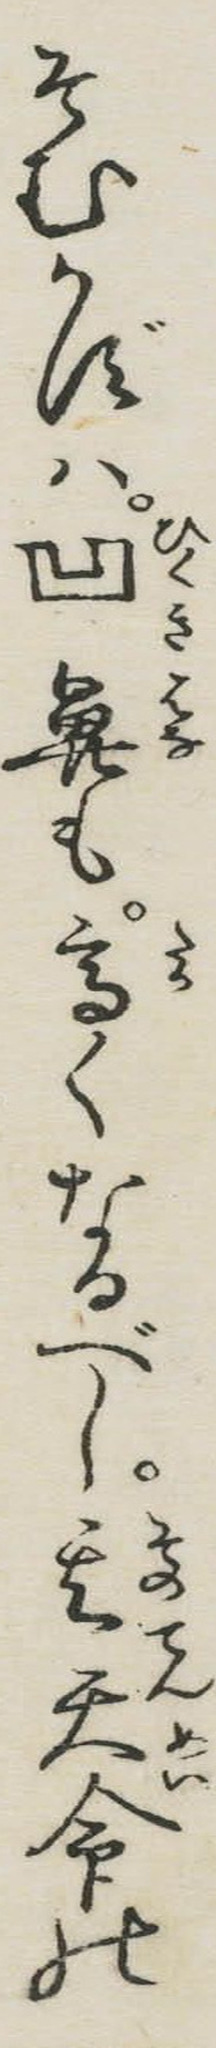そむかずは。凹鼻も。高くなるべし。其天命の
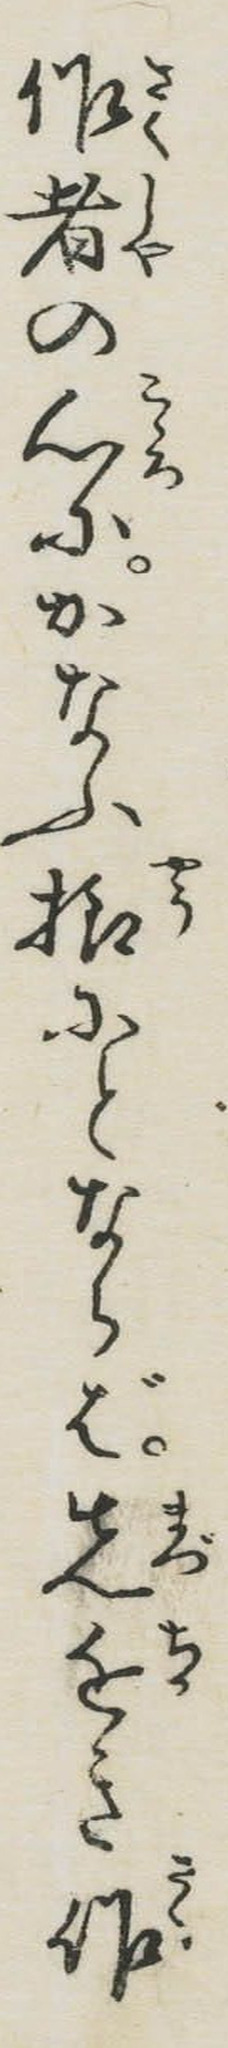作者の心に。かなふ様にとならば。先近き作
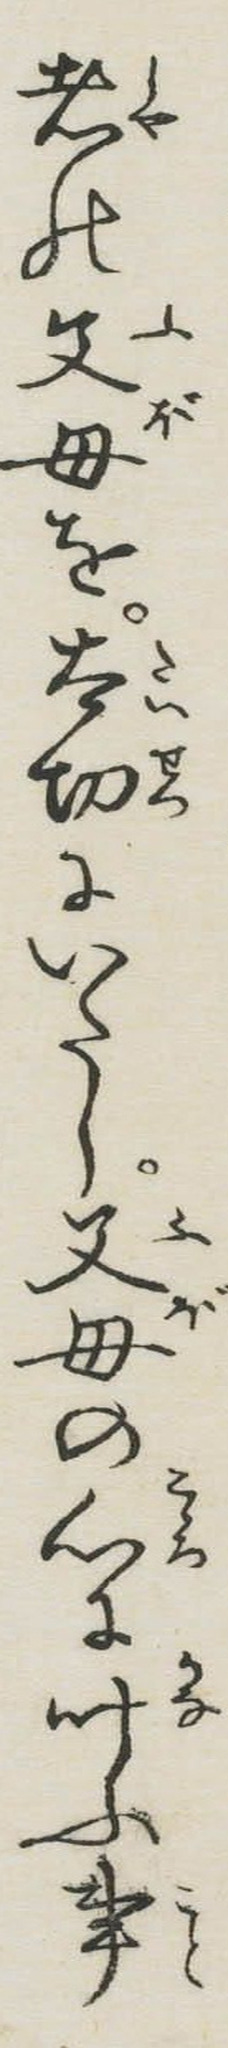者の父母を。太切にいたし。父母の心に叶ふ事
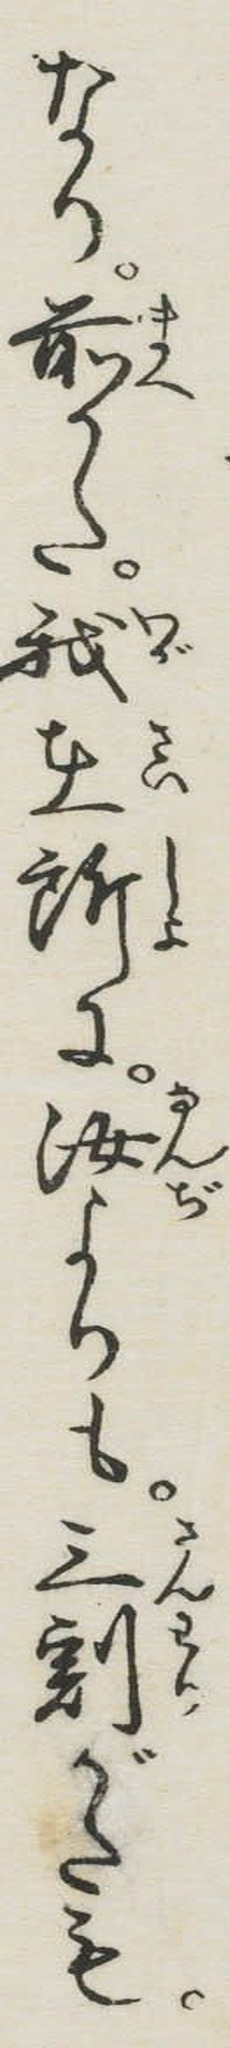なり。前かた。我在所に。汝よりも。三割がたも。
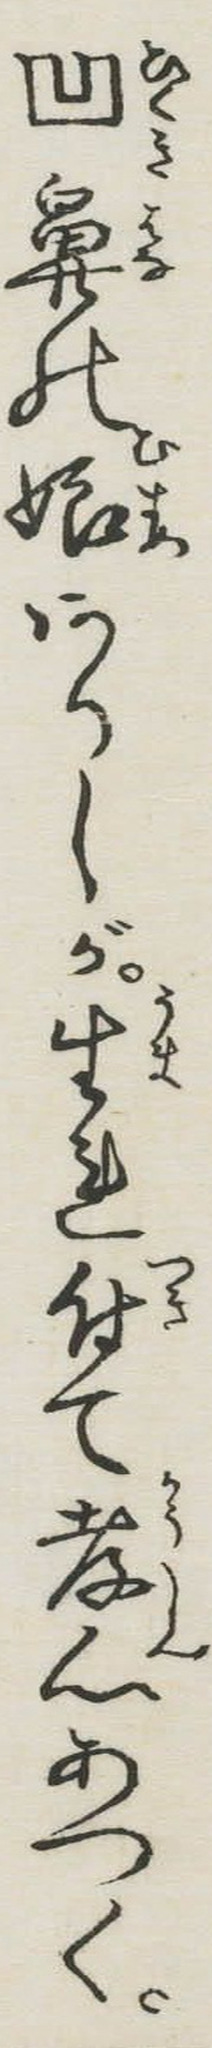凹鼻の娘ありしが。生れ付て孝心あつく。
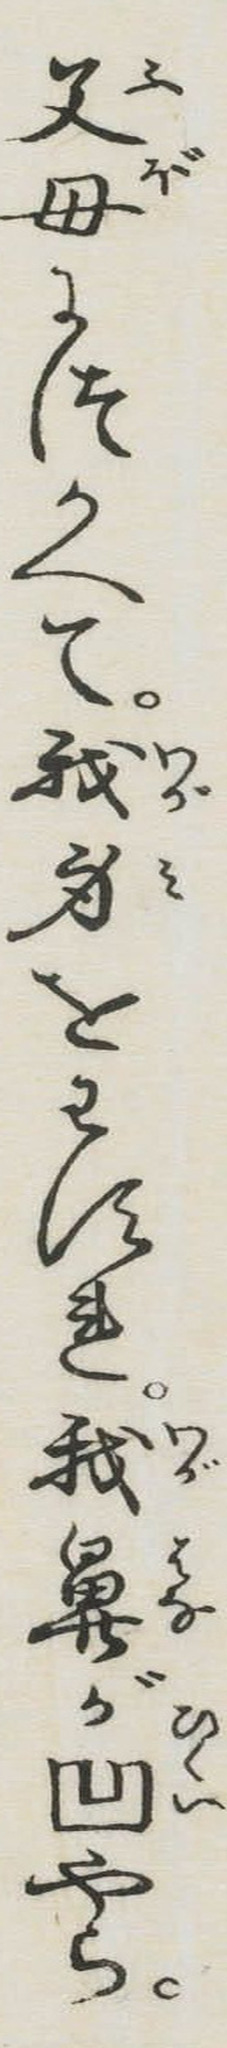父母につかへて。我身をわすれ。我鼻が凹やら。
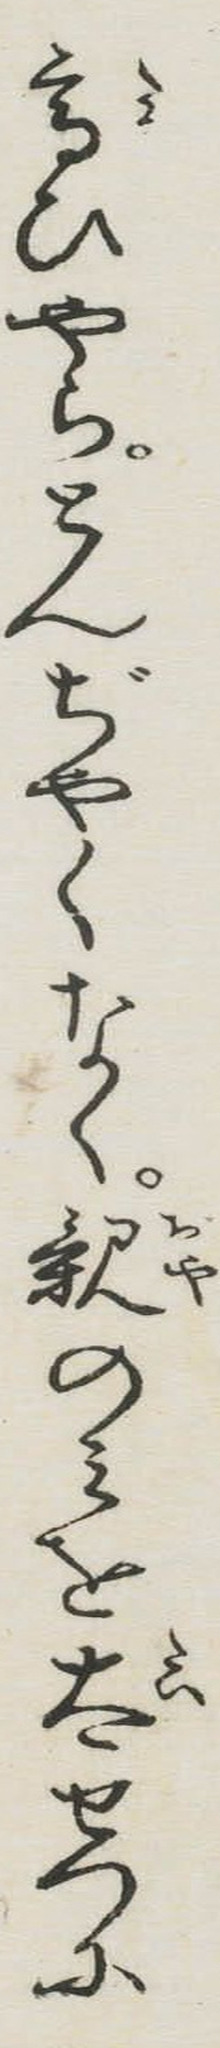高ひやら。とんぢやくなく。親のみを太せつに
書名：福神おしへの小槌 2巻 上
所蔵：東京学芸大学教育コンテンツアーカイブ
